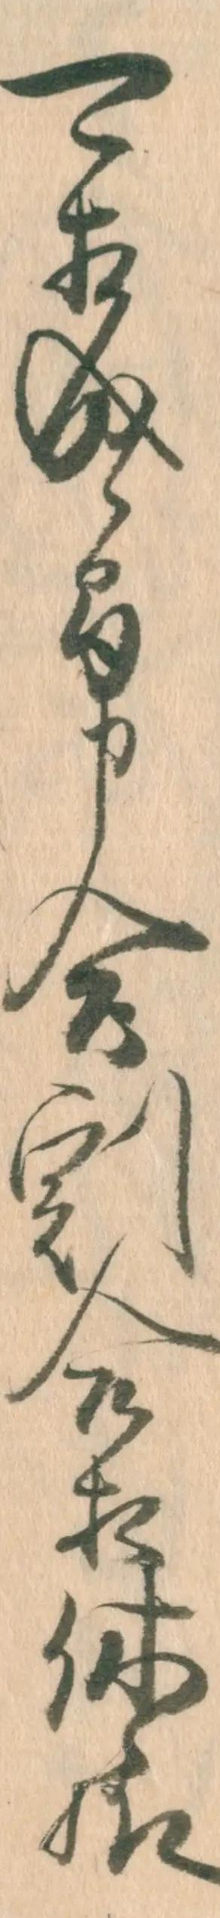可相成候間申合割合相休候様
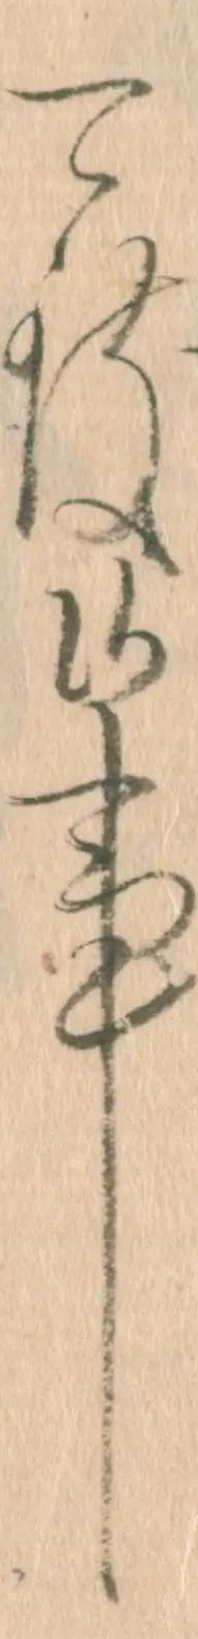可致候事
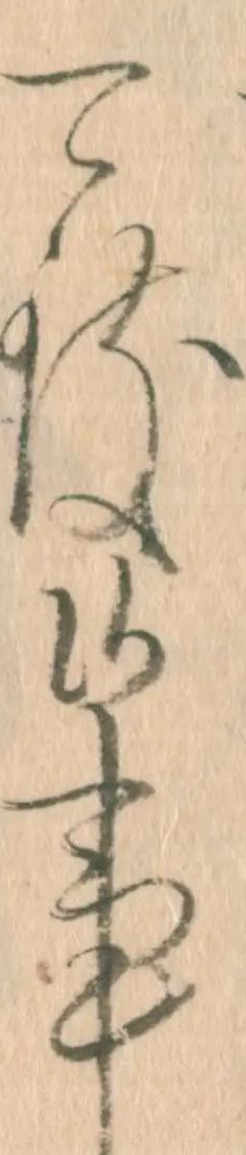可致候事
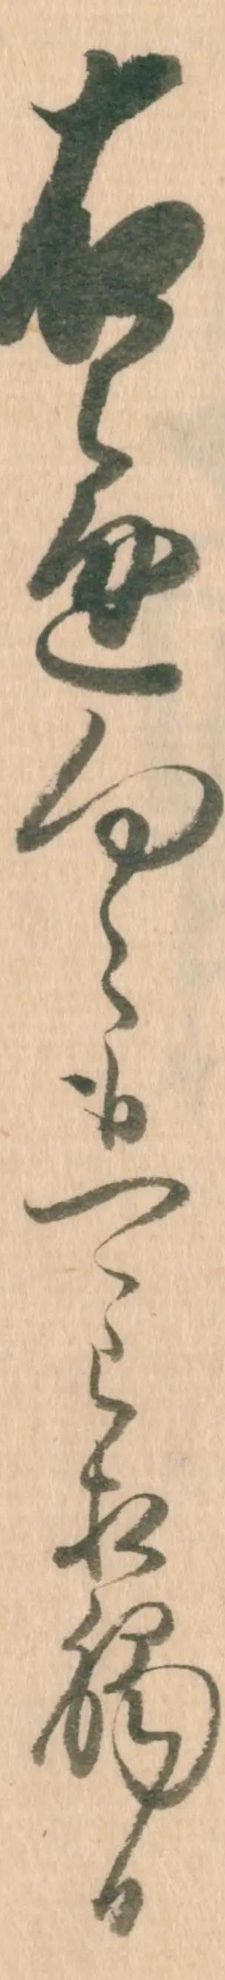右之通向〻え可被相触候
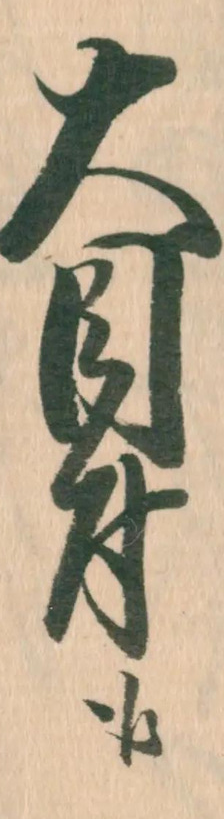│大目付え
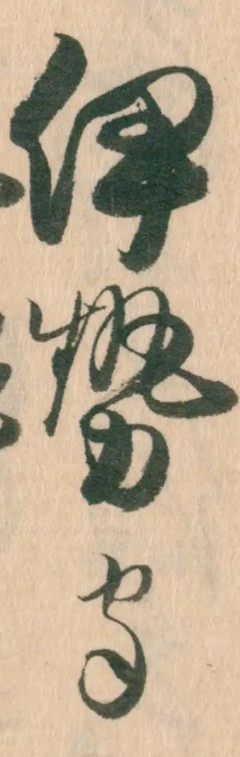伊㔟守
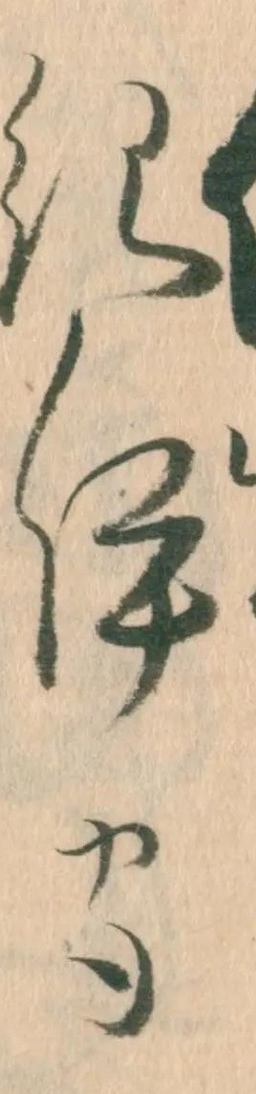紀伊守
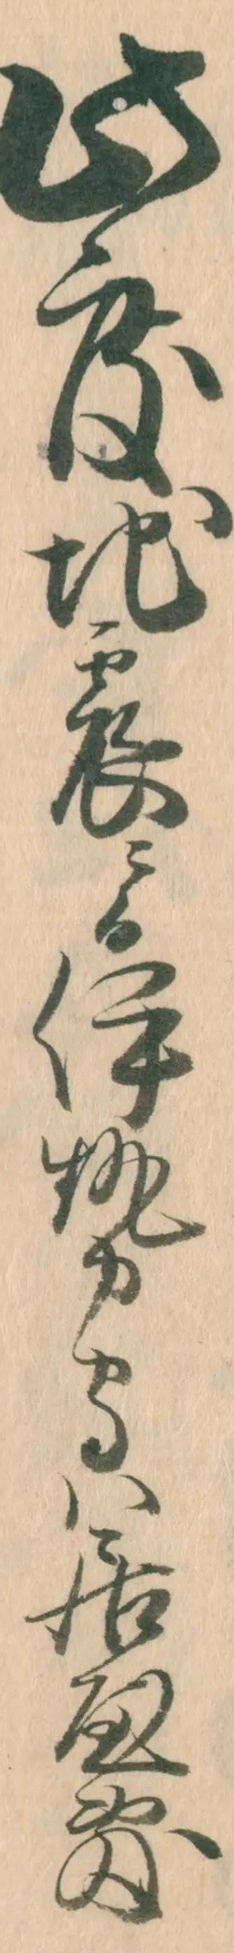此度地震ニて伊㔟守ハ居屋敷

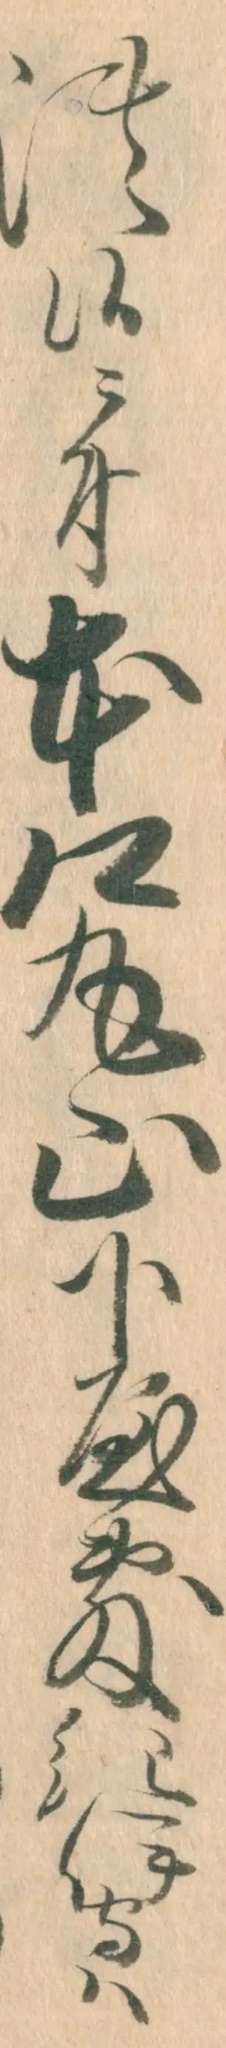潰候ニ付本郷丸山下屋敷紀伊守ハ
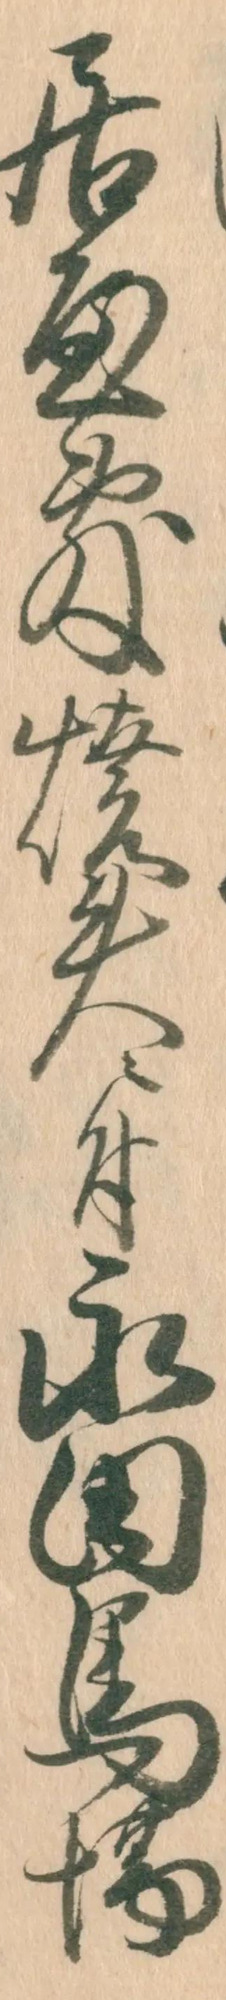居屋敷焼失ニ付永田馬場
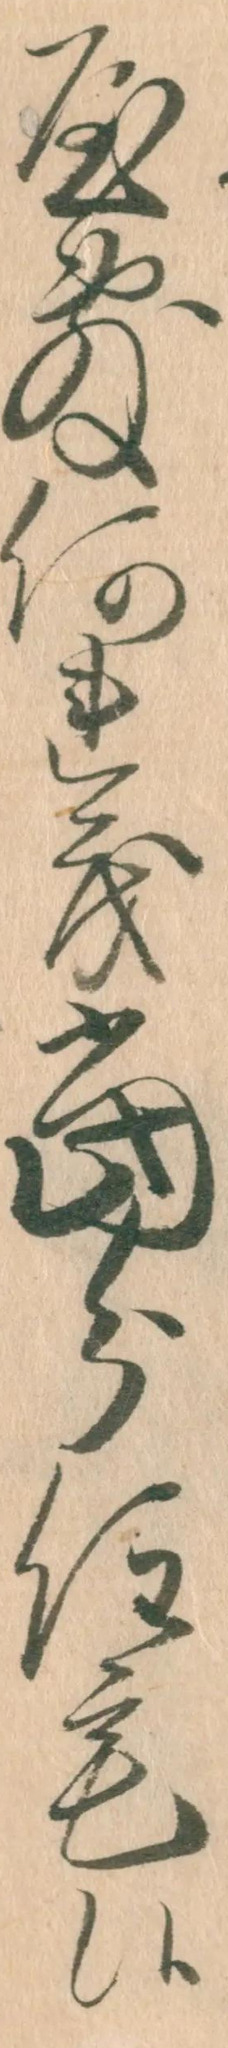屋敷何れも当分住宅候
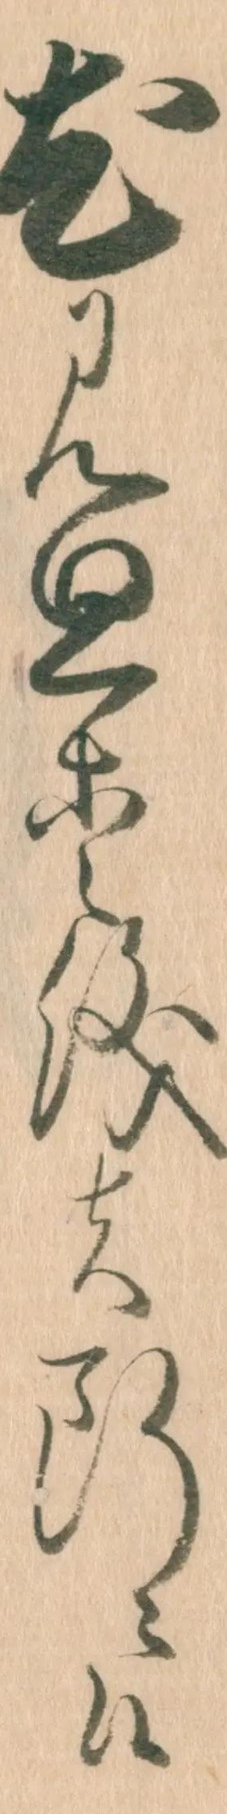尤見廻等之儀は断ニ候
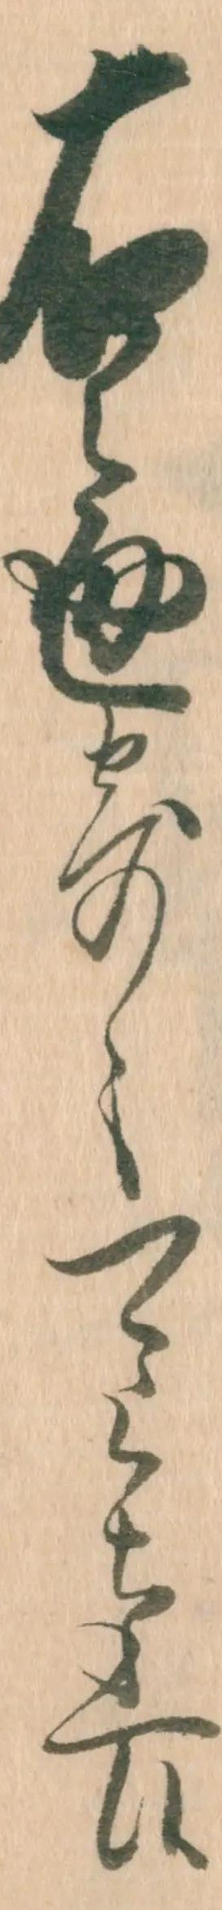右之通寄〻可被達候
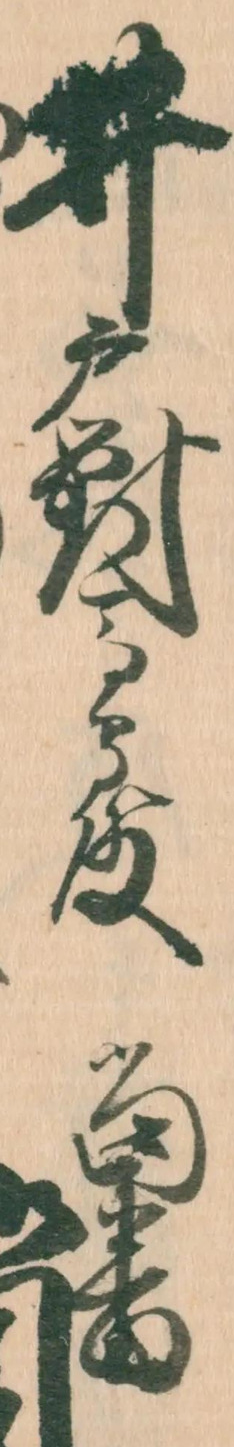│井戸対馬守殿当番

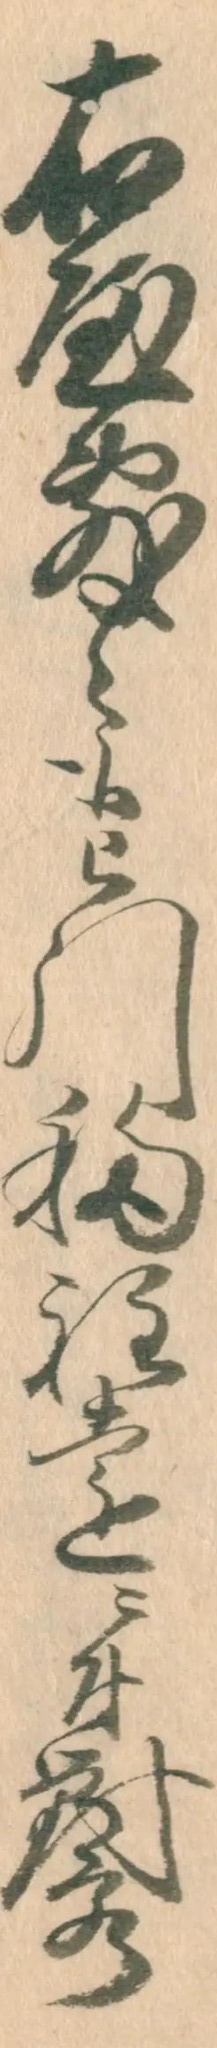右屋敷〳〵え被引移程遠ニ付対客
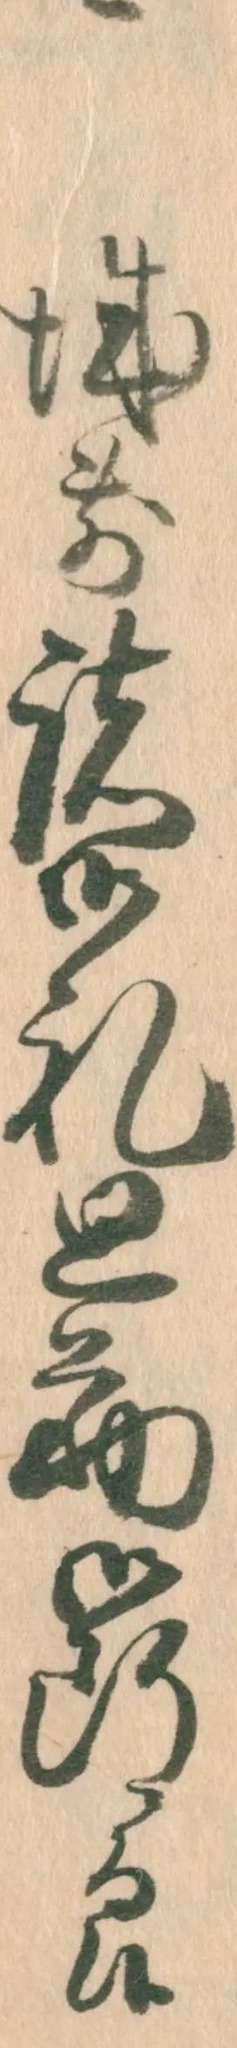登城前諸御礼廻勤御断ニて候
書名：地震災書留 2巻. [2] 内表紙に「地震一件　安政二卯年十月」とあり
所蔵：国立国会図書館 National Diet Library, JAPAN
